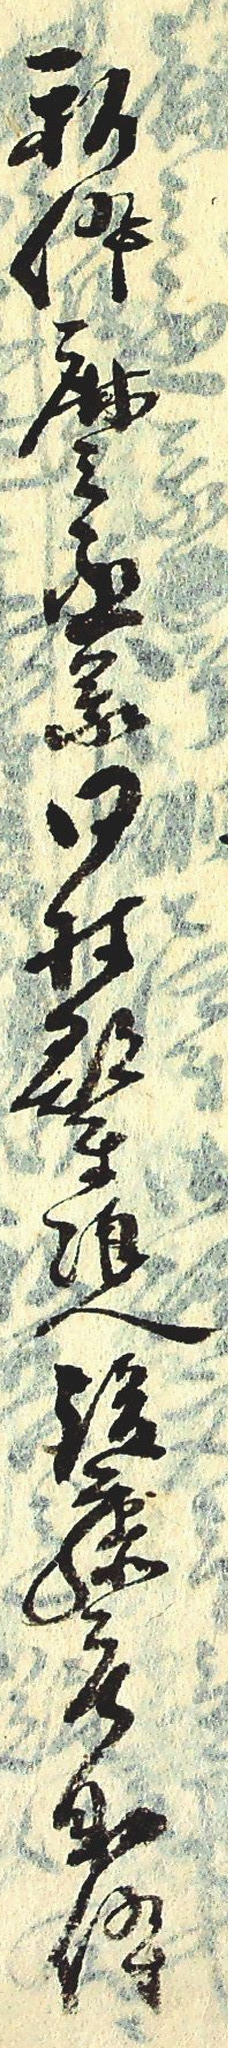私倅麻之丞義同村郡付浪人後藤庄助倅
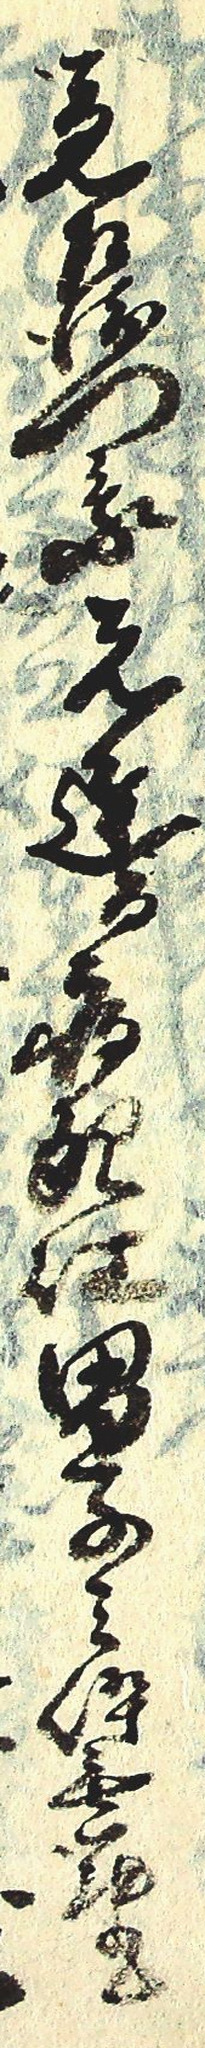覚左衛門義先達て病死仕男子之倅無御座候
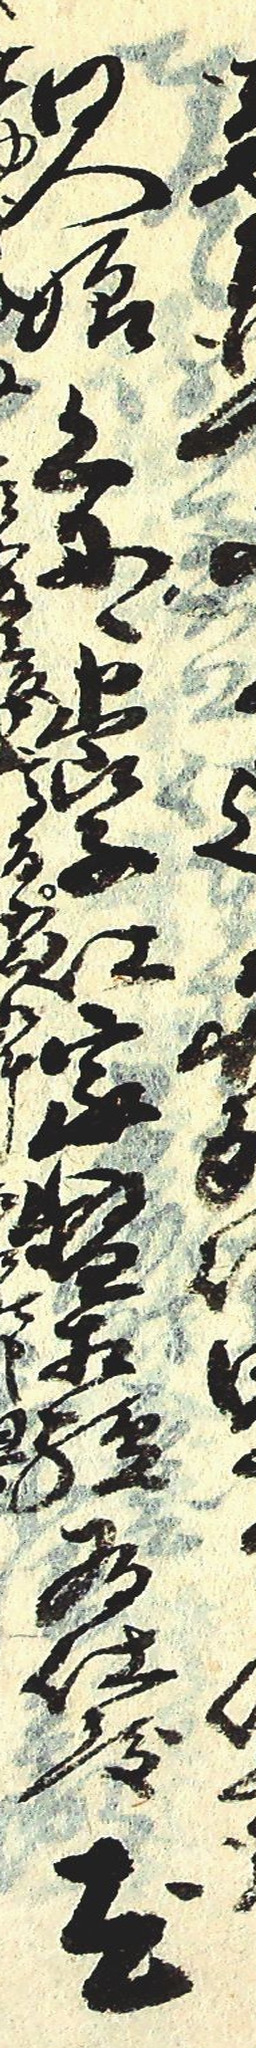同人娘くにへ養子仕家督相続為仕度尤
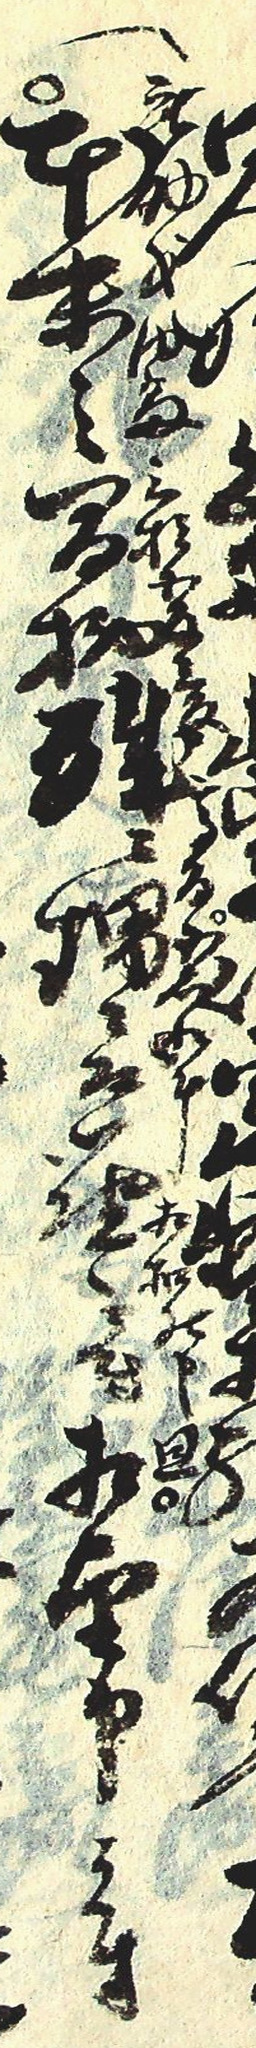本末之間柄殊に甥にて御座候に付相望申に付
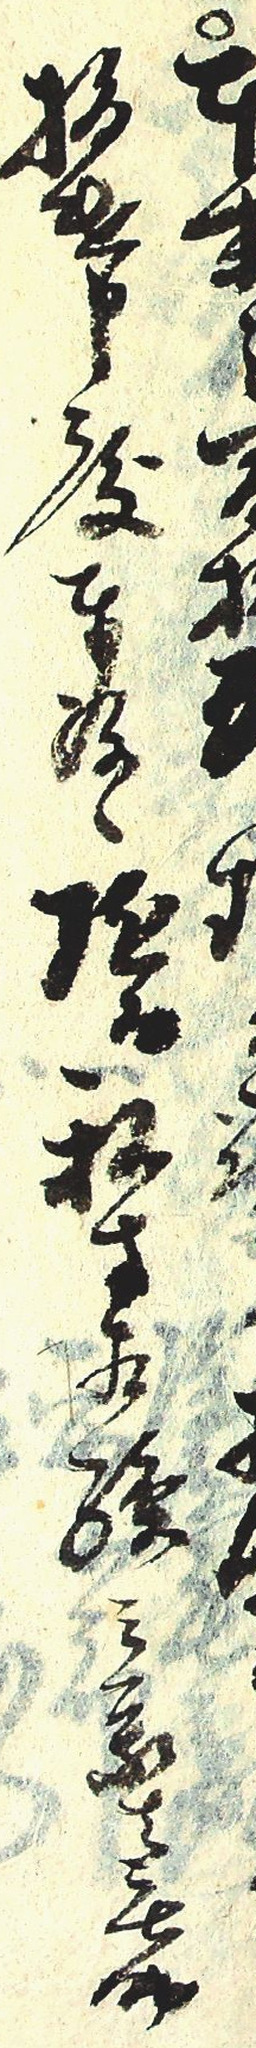指遣申度奉存候随て私方相続之義は庄助

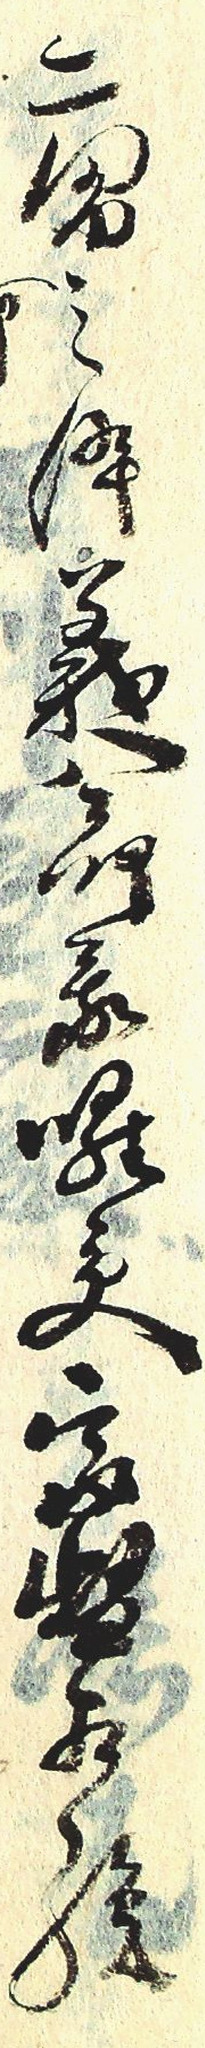二男之倅義八郎義囉受家督相続
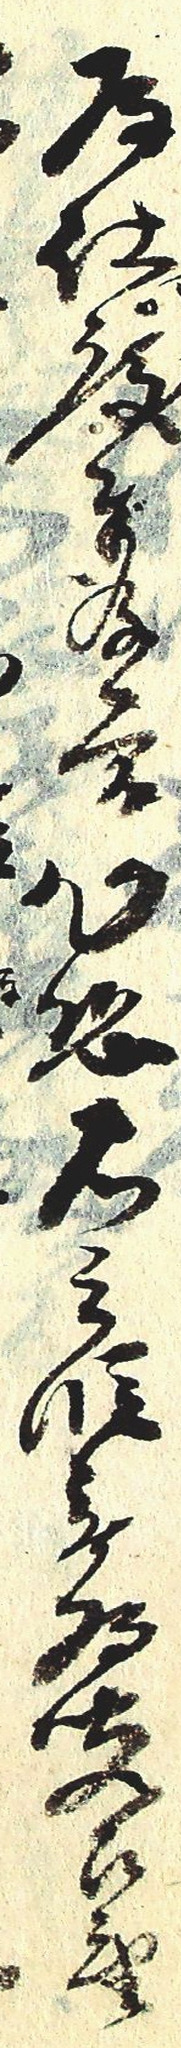為仕申度奉存候間乍恐右之段被為聞召届
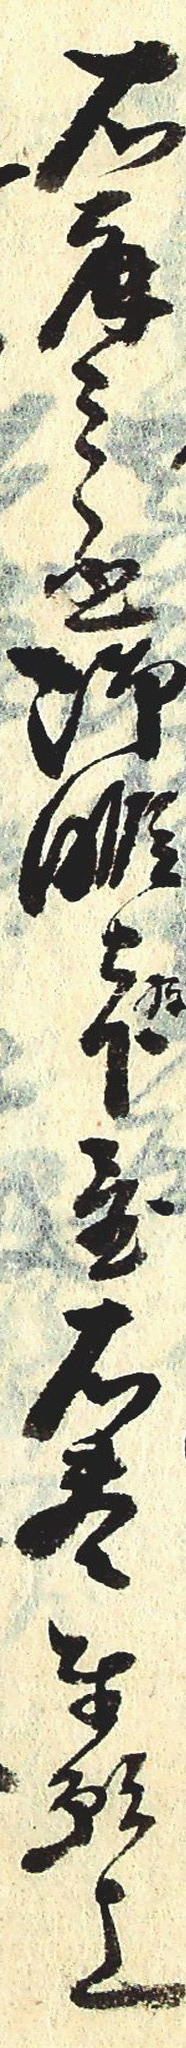右麻之丞御暇被為下置右夫々奉願上
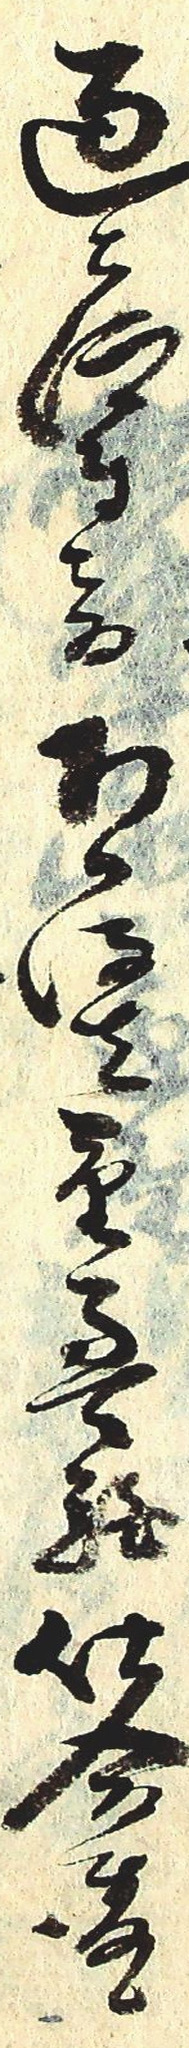通被仰付被為下候得は重畳難仕合奉存候
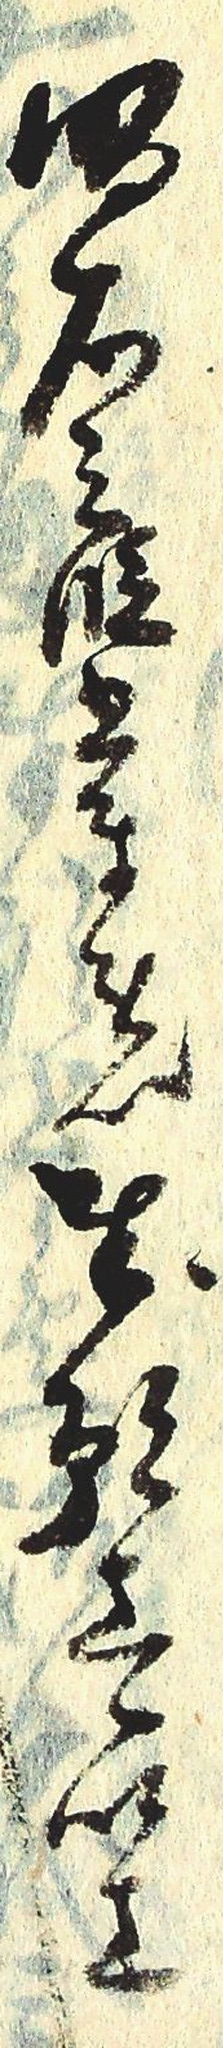仍て右之段書付を以奉願上候以上
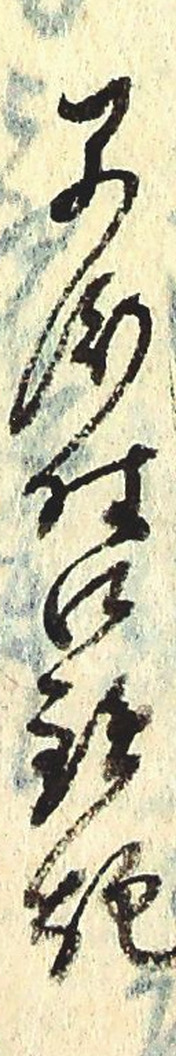早淵村郷鉄炮
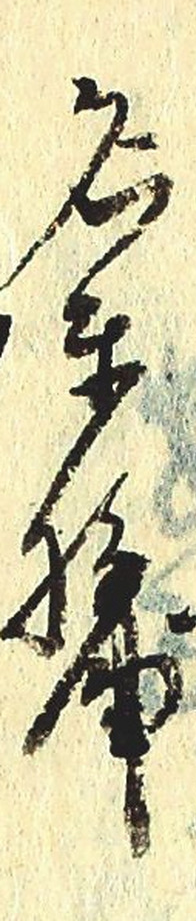名東勝浦
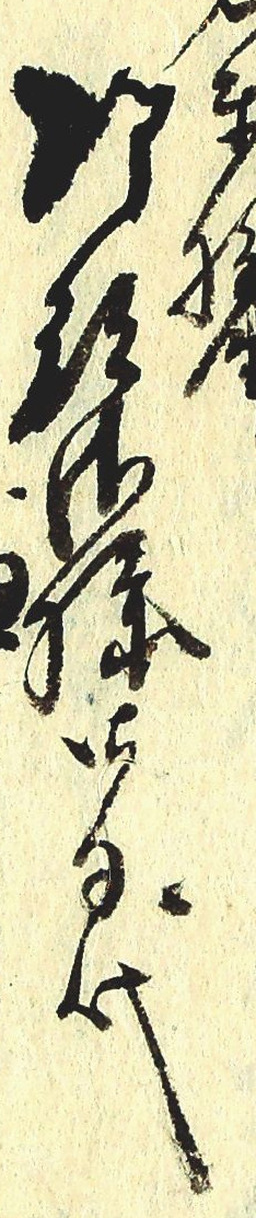御郡代様御手代
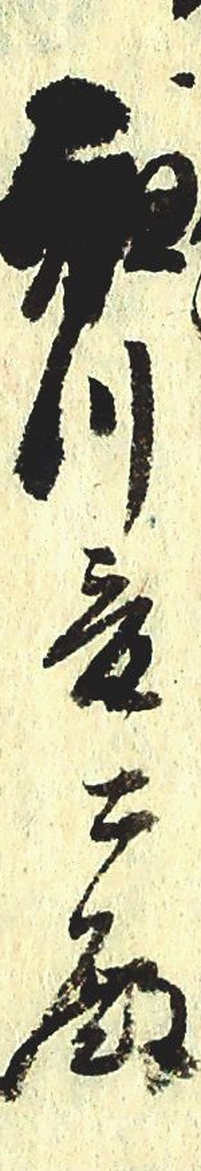祖川益二殿
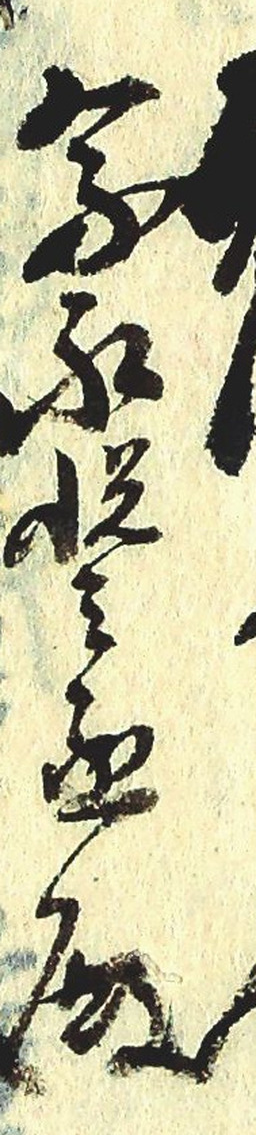富永悦之丞殿
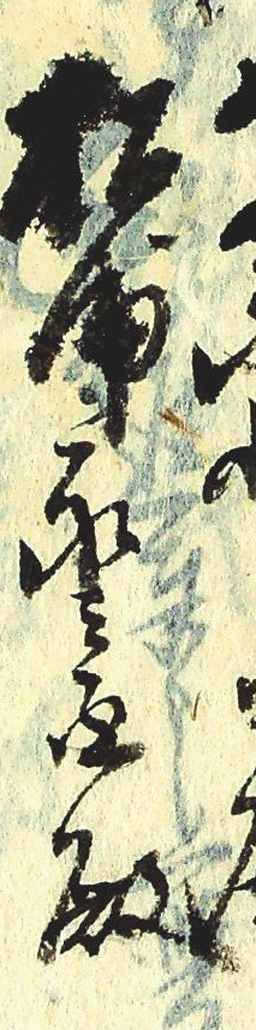松浦永之丞殿
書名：諸御願書控(弐番）
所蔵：鳴門教育大学 Naruto University of Education
